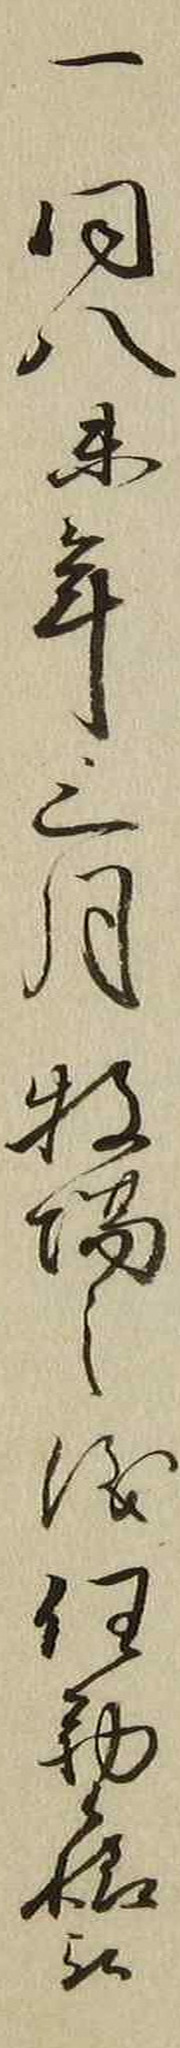一同八未年三月牧場之儀任勤候様被
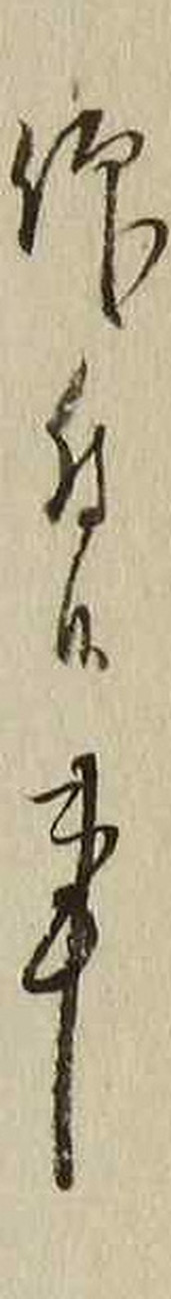仰付候事
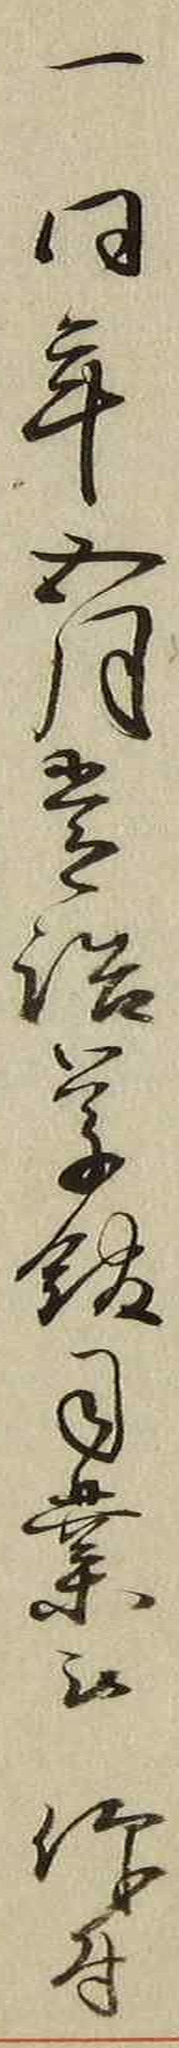一同年五月常詰学館司業被仰付
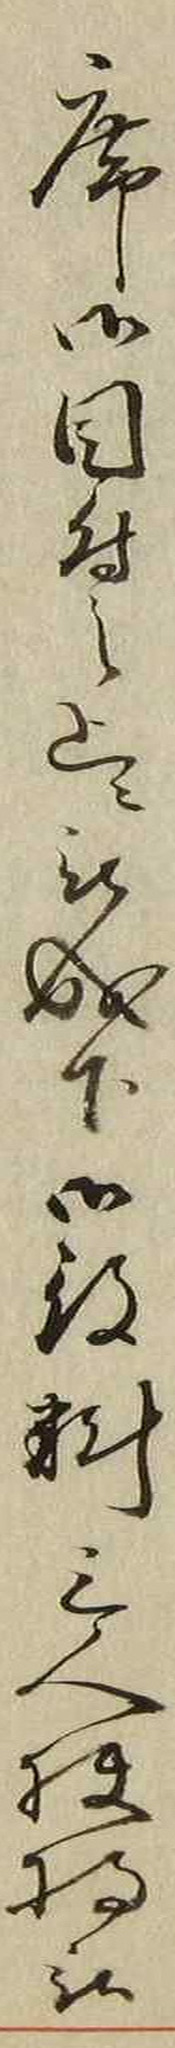席御目付之上に被成下御役料三人扶持被
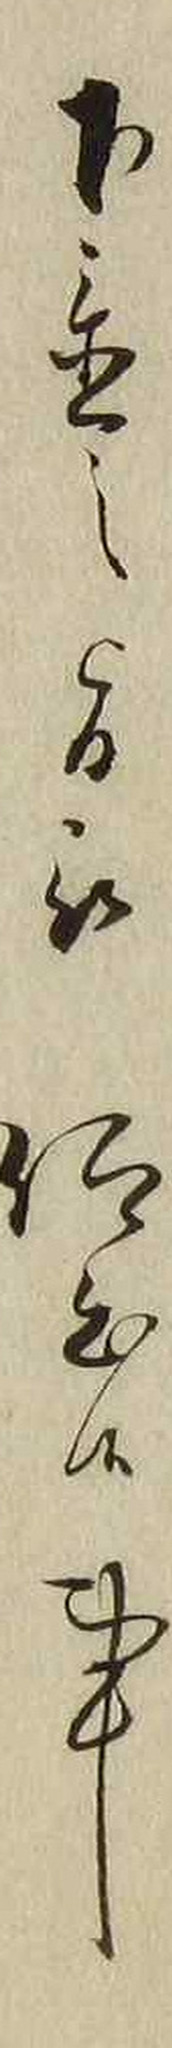下置之旨被仰出候事
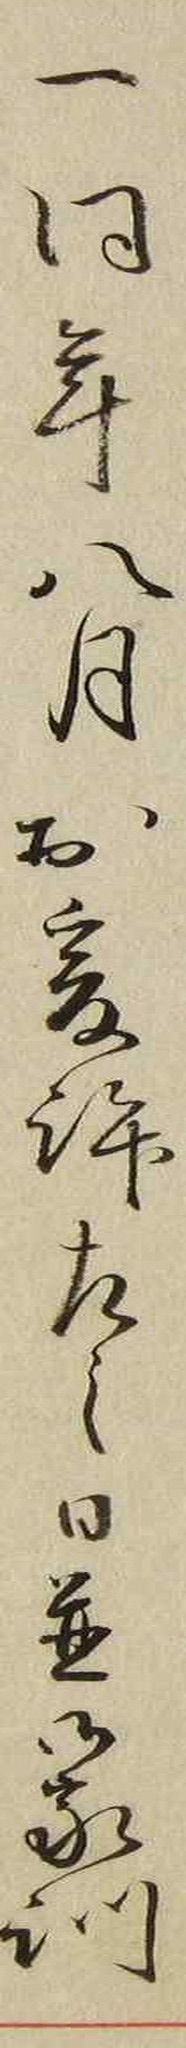一同年八月於爰許左之日並御家訓
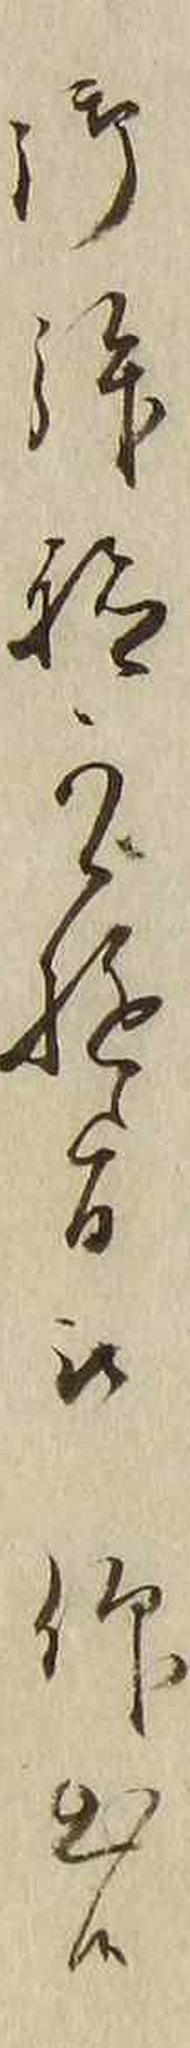御拝可被遊之旨被仰出候

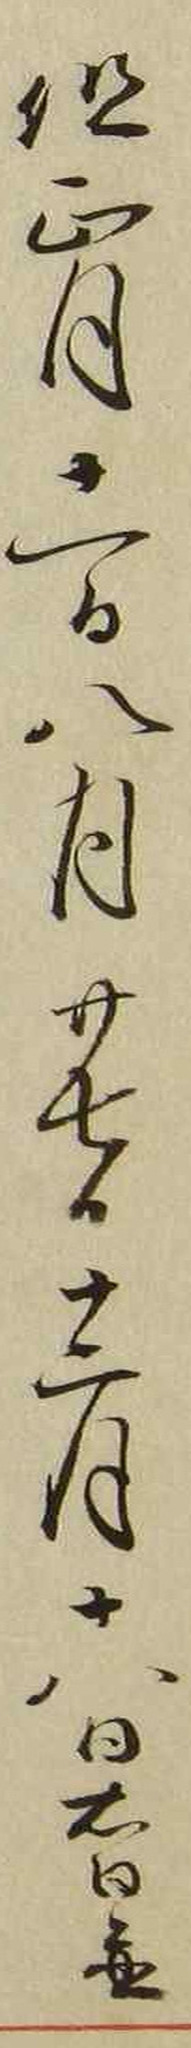但正月十一日八月廿七日十二月十八日右日並
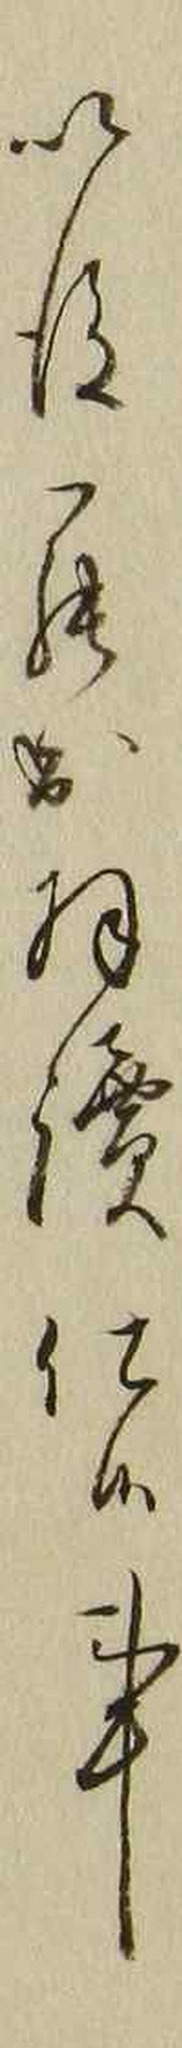以後罷出拝読仕候事
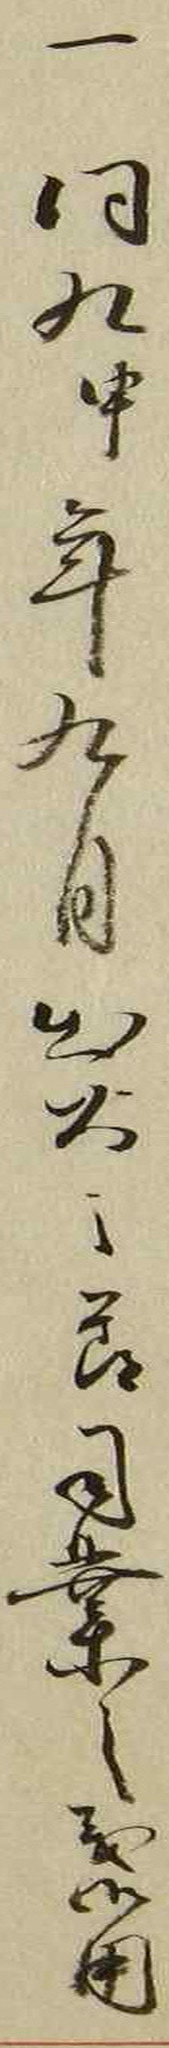一同九申年九月出火之節司業之義御用
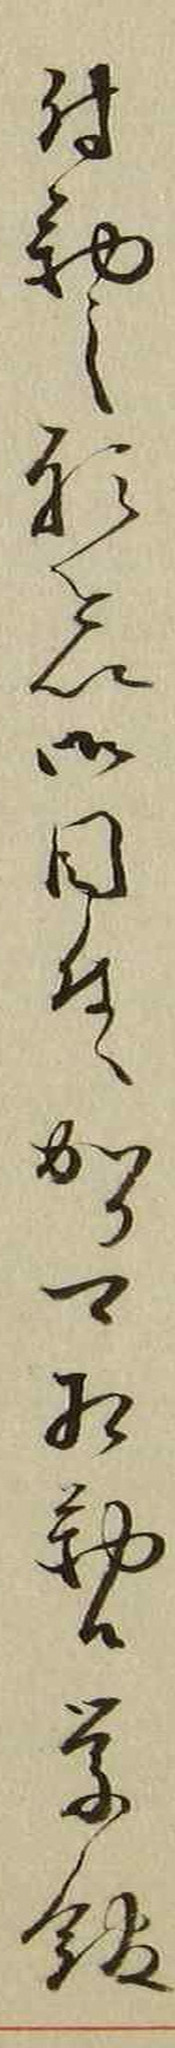付勤之願を以御用付へ加り可相勤候学館
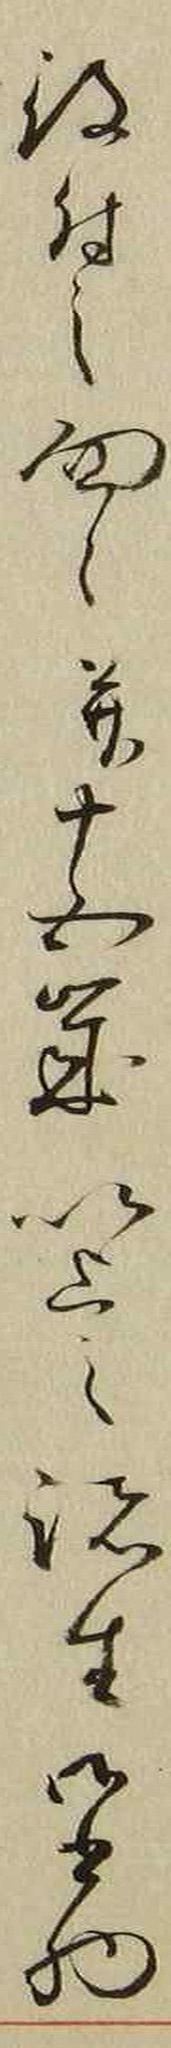役付之面々并十五歳以上之諸生御書物
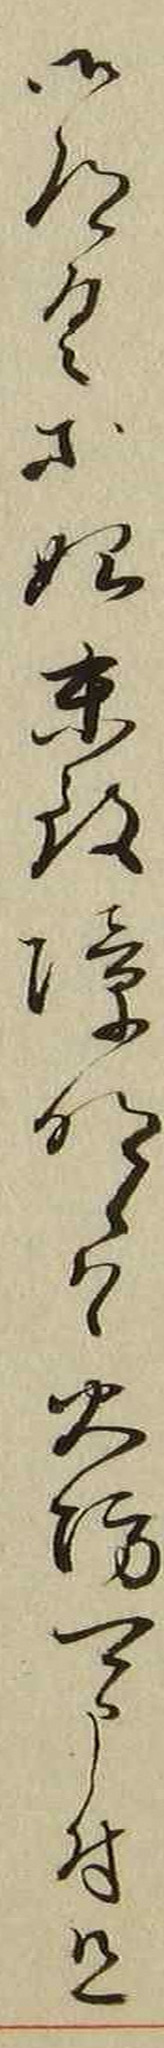御道具等始末致障明候ハヽ火防可申付且
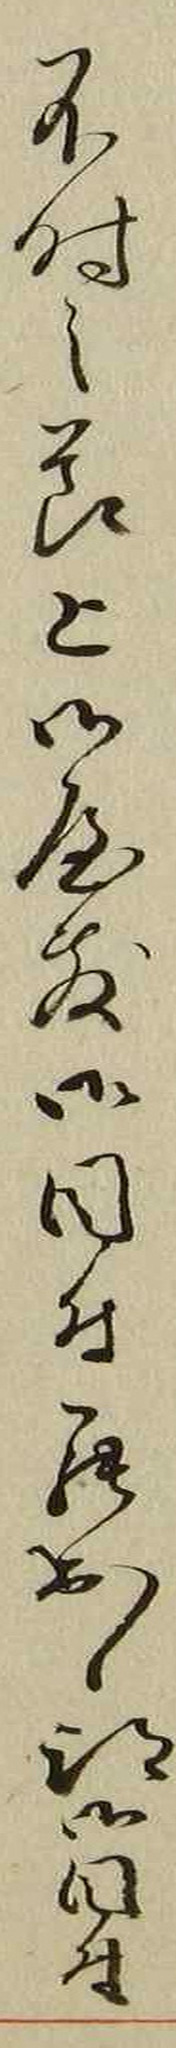不時之節上屋敷御目付罷出候跡御目付
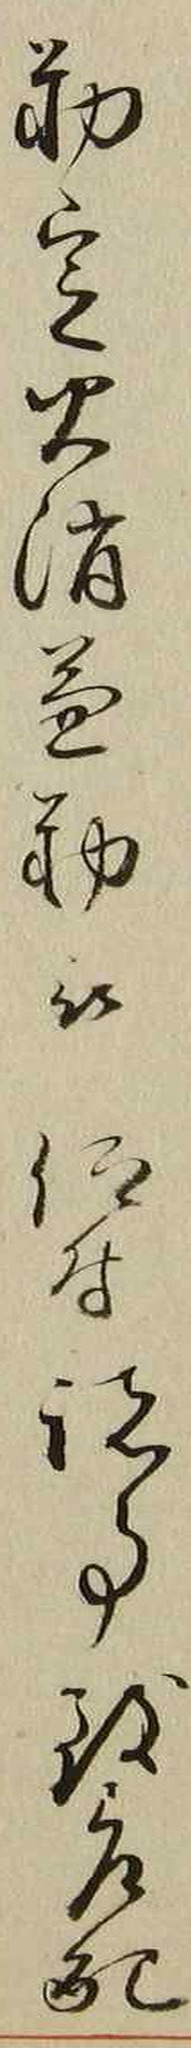勤定火消兼勤被仰付諸事致差配
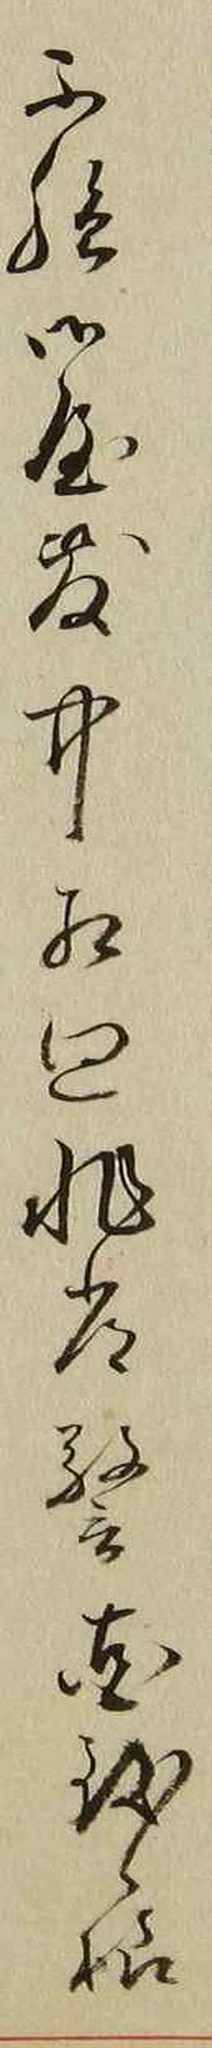不給御屋敷中相廻非常警固致候様
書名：諸士系譜　巻之3　い之部3
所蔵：会津若松市立会津図書館
